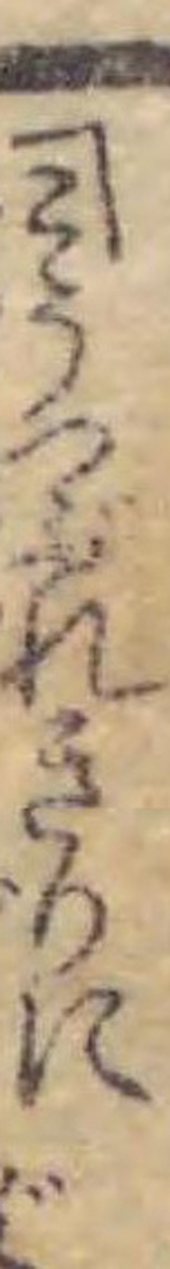〽こうつぶれきりに
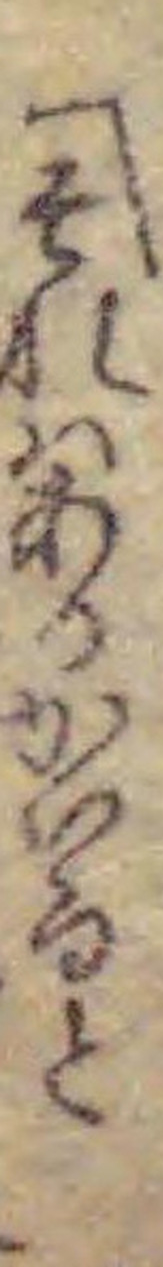〽それはあかかいると
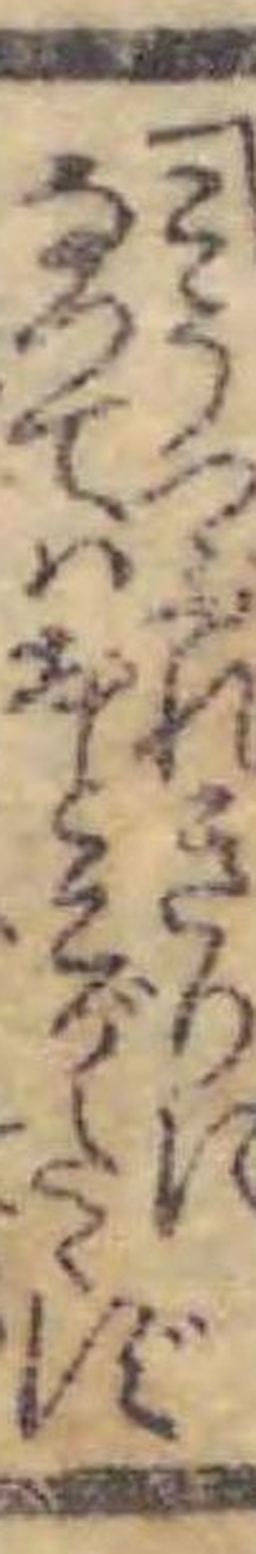なつてはおとこがたゝず
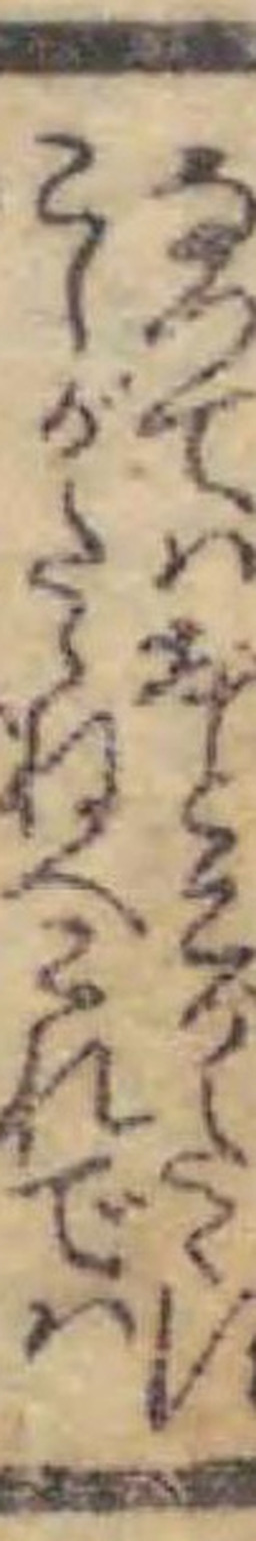こしがたゝねへこれでは
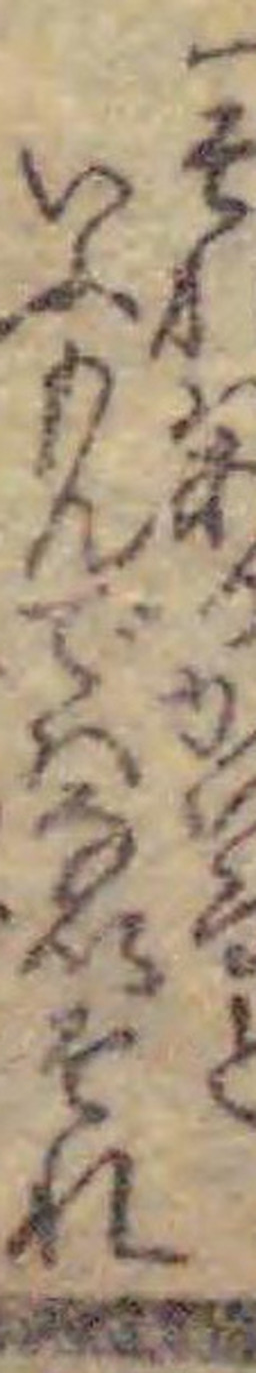いふもんではないそれ
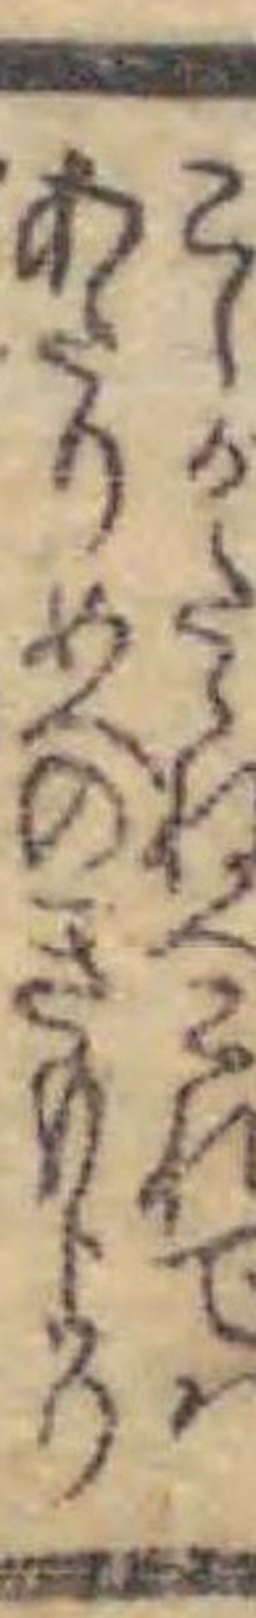あたりめへのきもより
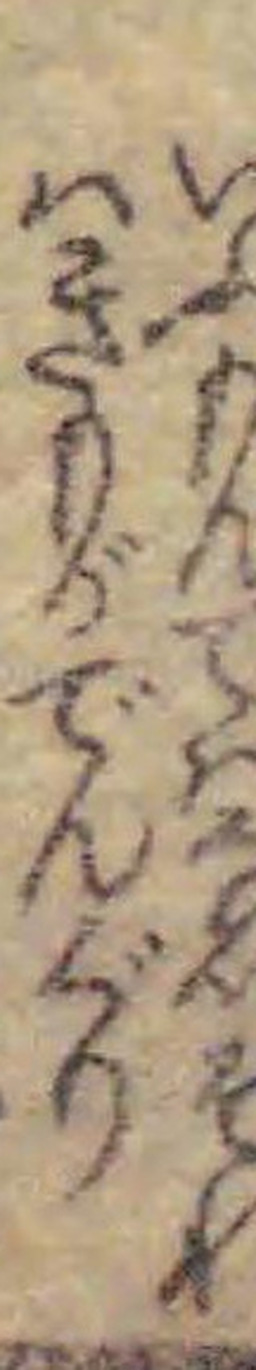はきもがでんぐり
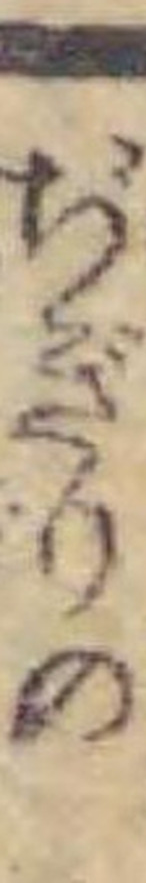ぢぎりの
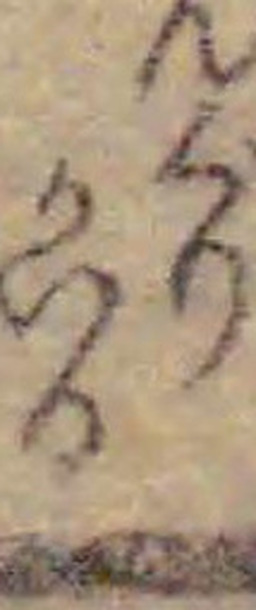かいる
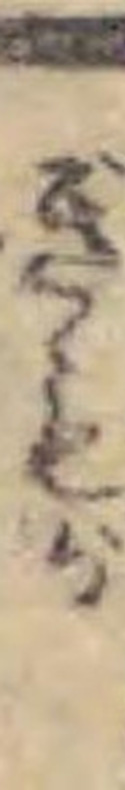きもが
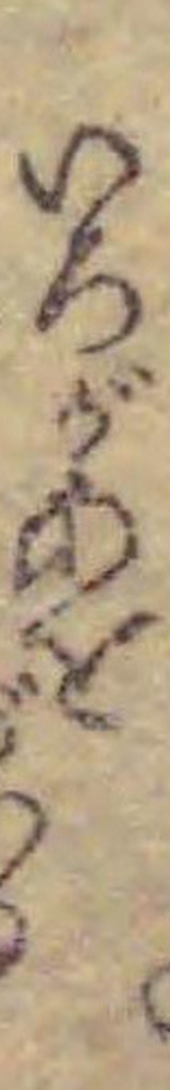いろがあを
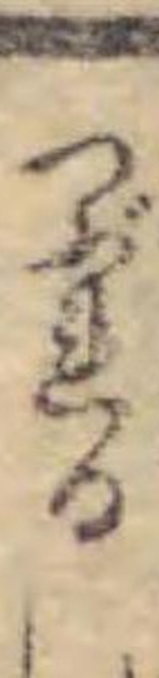つぶれる
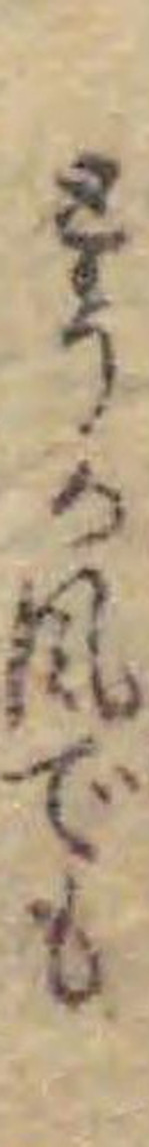とうか風でも
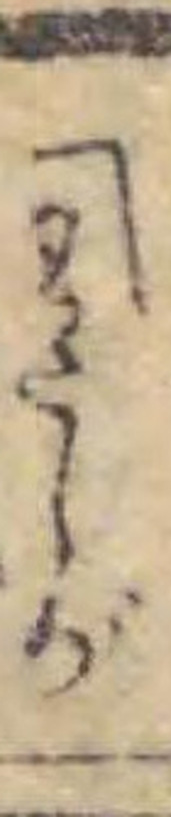〽わたしが
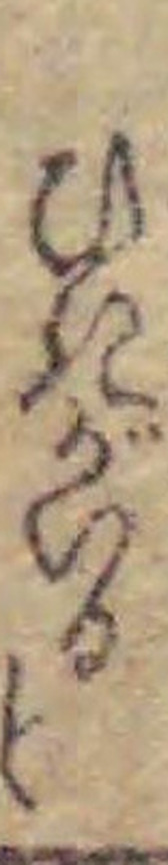ひきがいる
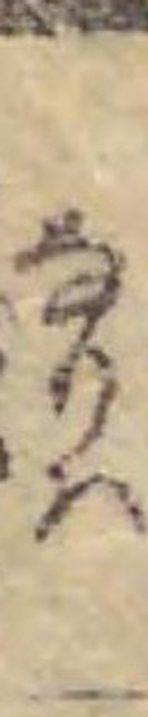なりは
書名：十四傾城腹之内 : 3巻
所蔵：国立国会図書館 National Diet Library, JAPAN
